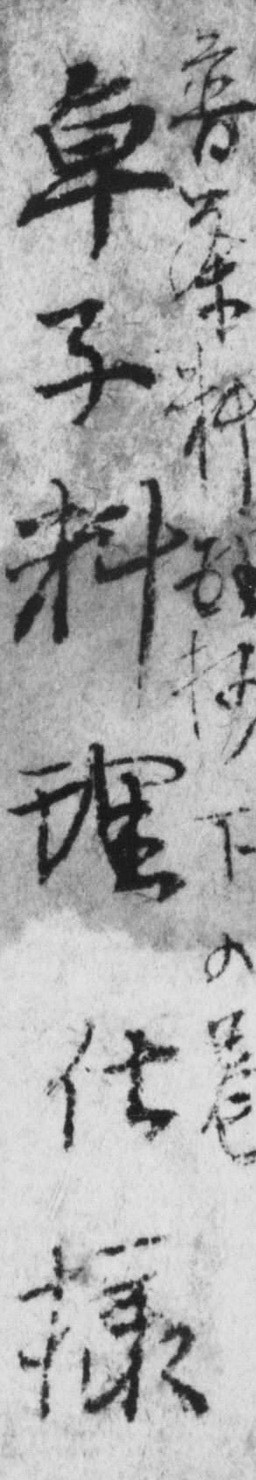卓子料理仕様

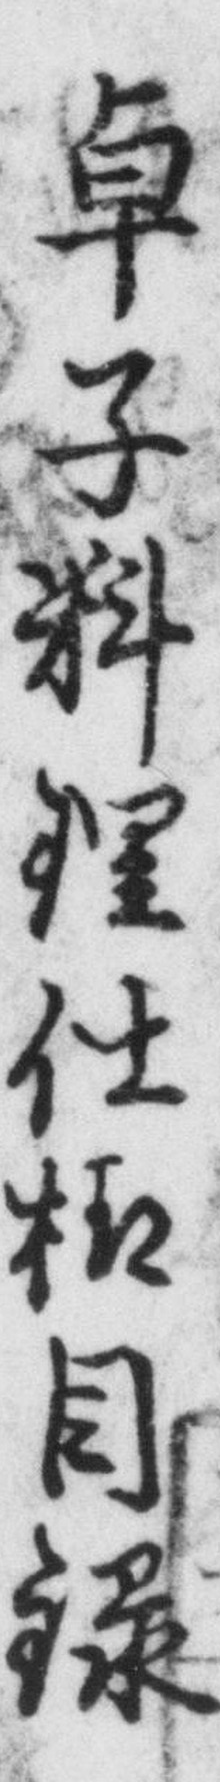卓子料理仕様目録

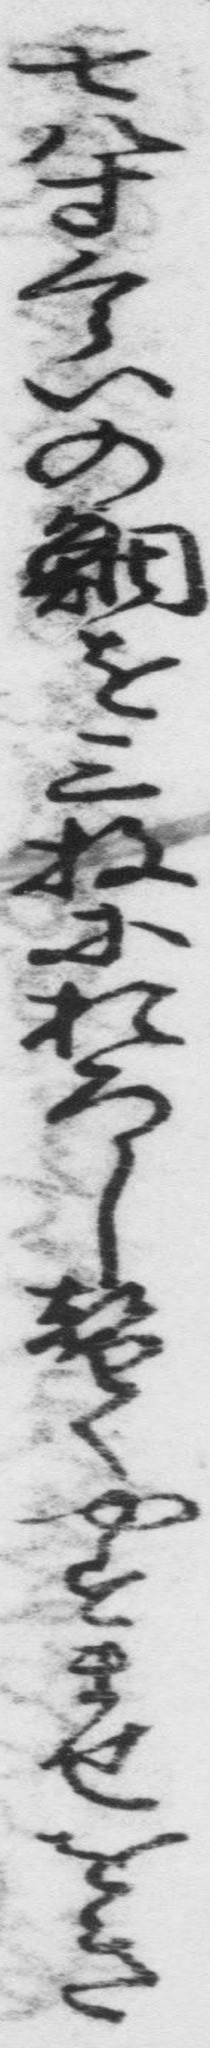七八寸くらいの鯛を三枚におろし暫くやすませをき
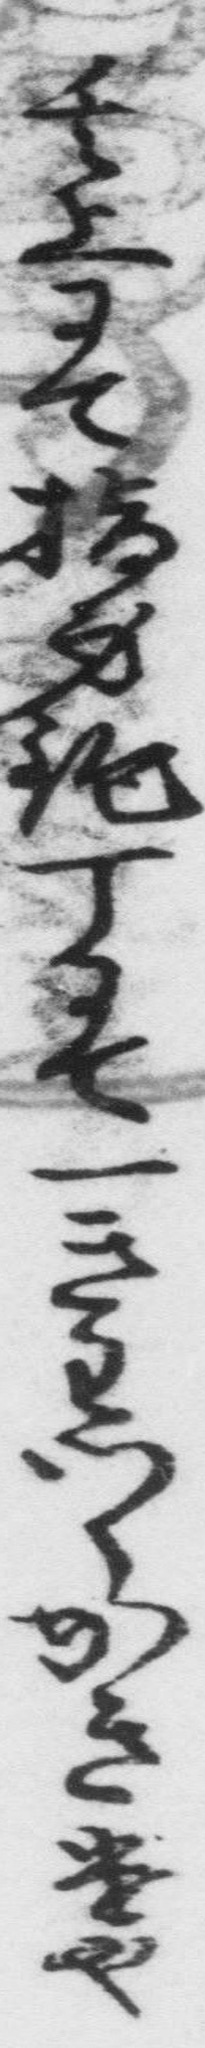其上にて指身鉋丁にて一きわつゝかき遣也
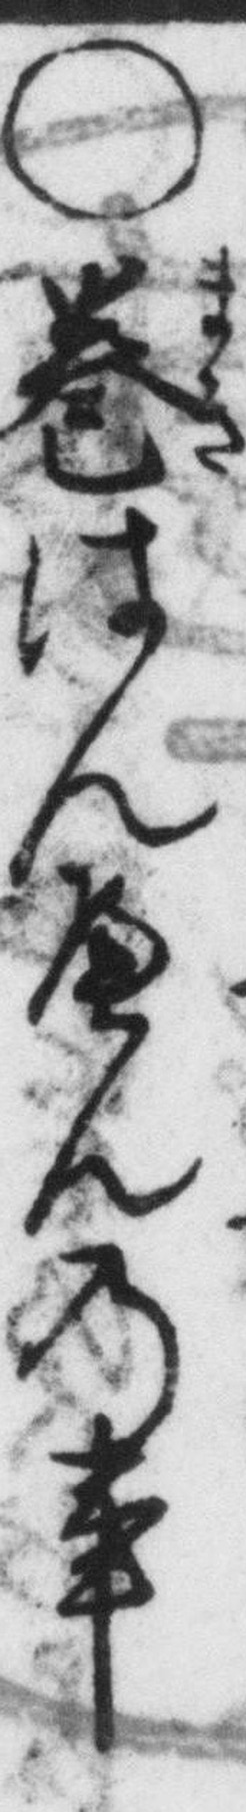○巻はんへんの事
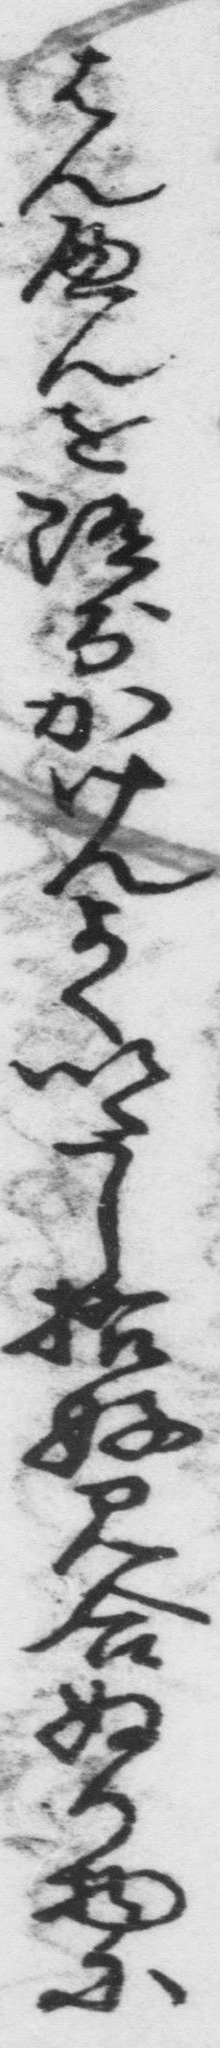はんへんを随分かけんよくいたし格好見合ぬり物に
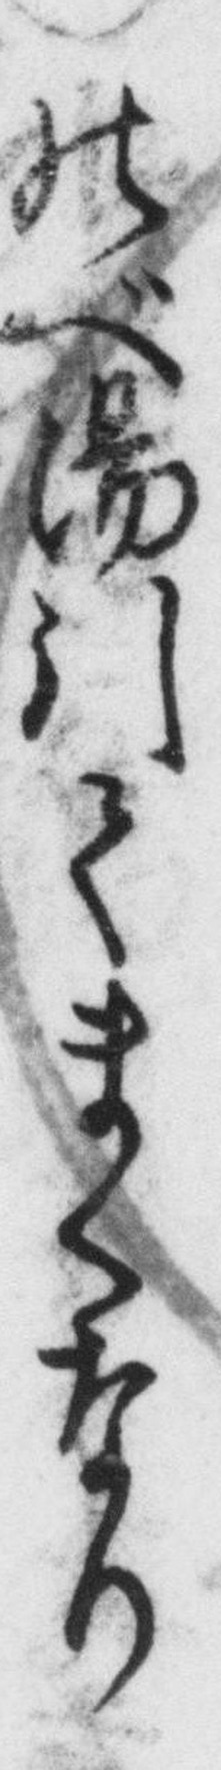のべ湯引てまくなり
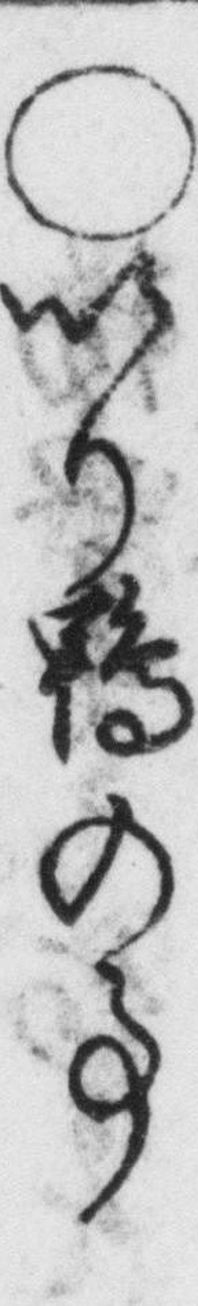○いり鴨の事
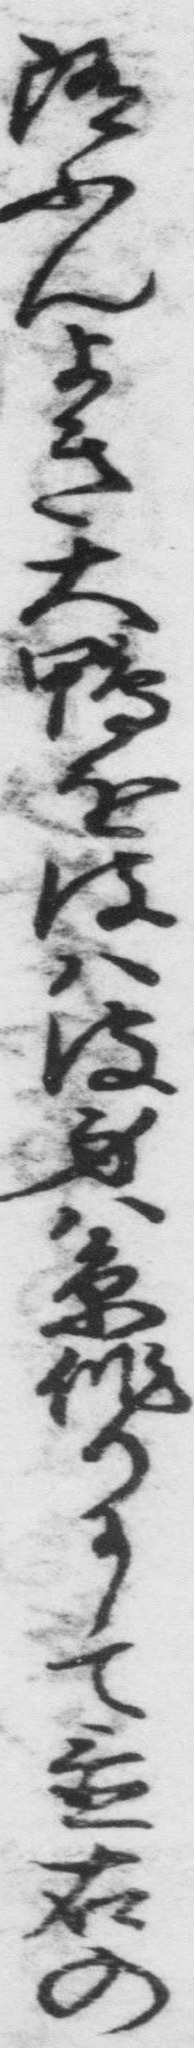隨ふんよき大鴨を皮は皮身は糸作りにして置右の
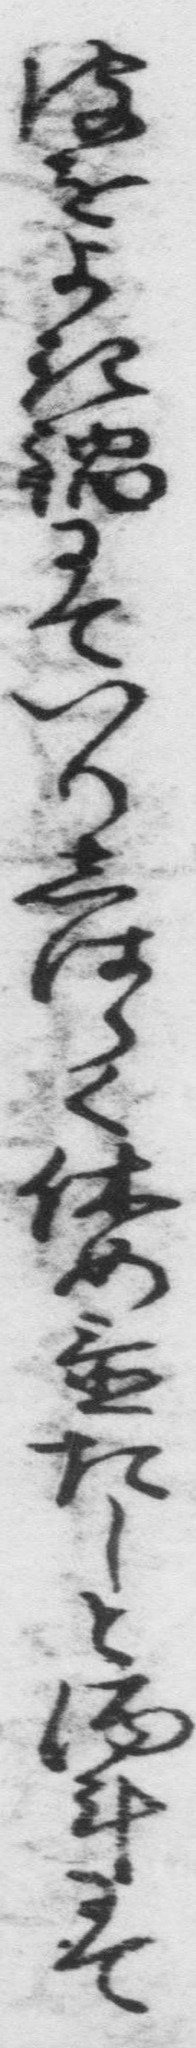皮をよき鍋にていりしはらく休め置たしと酒斗にて

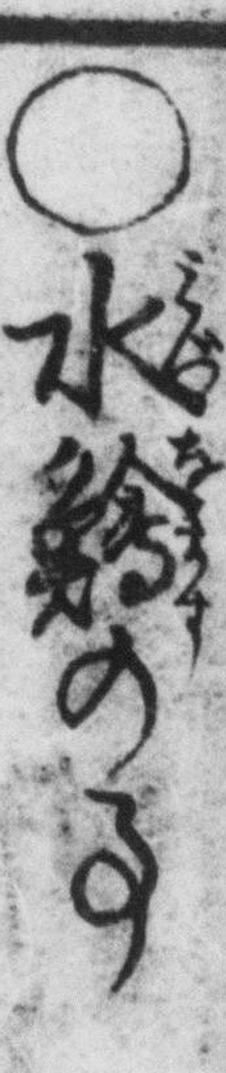〇水鱠の事
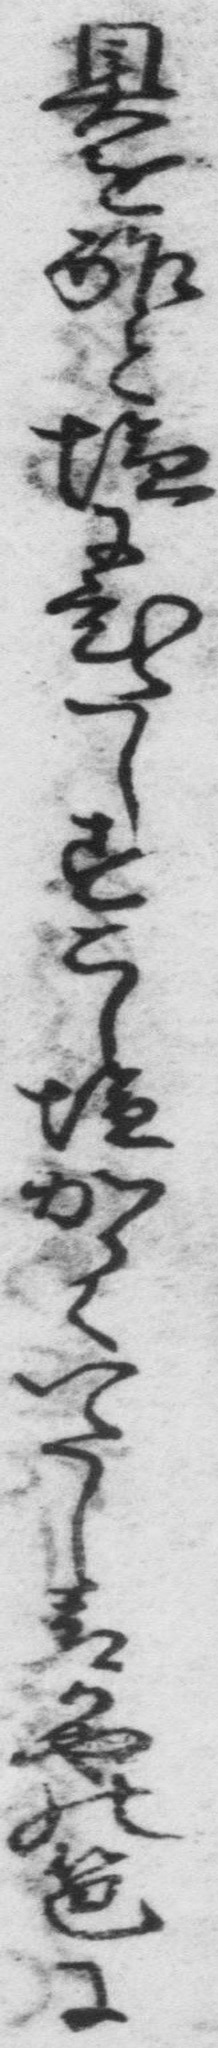具を酢と塩にひたしすこし塩からくいたし青かやの笹に
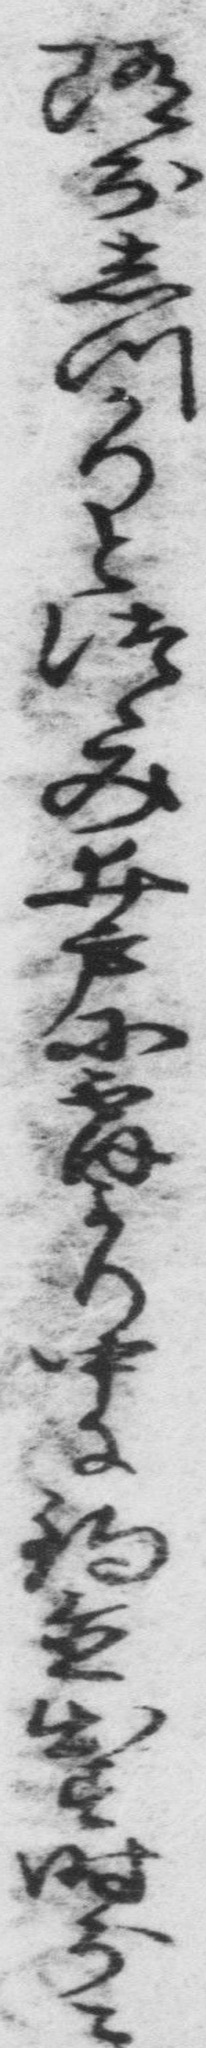随分しつかりとつゝみ井戸に宵より中に釣置出す時分に
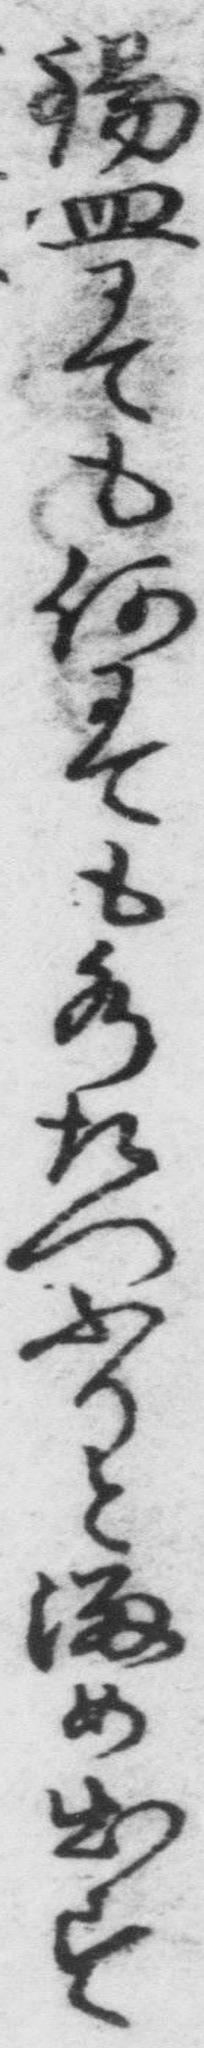錫皿にても何にてもみずたつふりと溜め出す
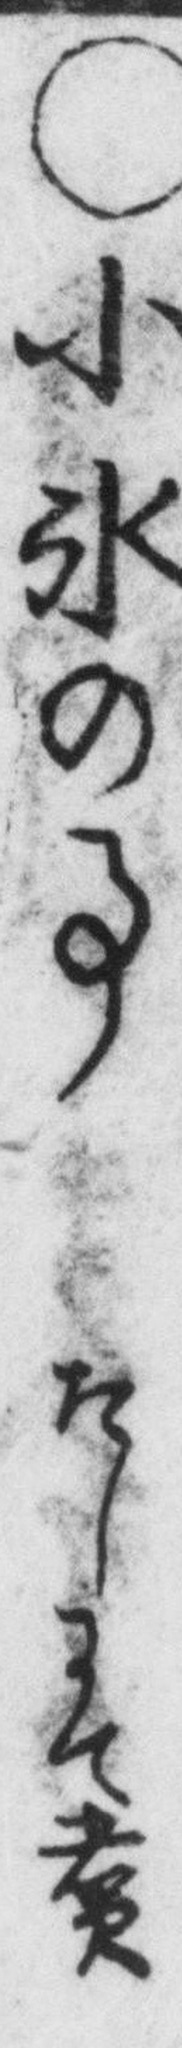〇小氷の事たしにて煮
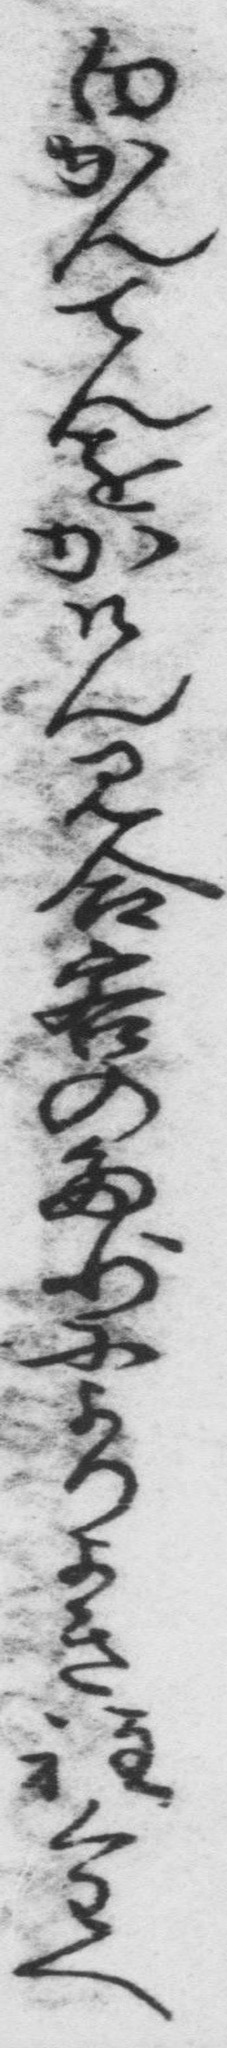白かんてんをかけん見合客の多少によりよき程くわへ
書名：卓子料理仕様
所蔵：大阪府立大学学術情報センター 国文学研究資料館
